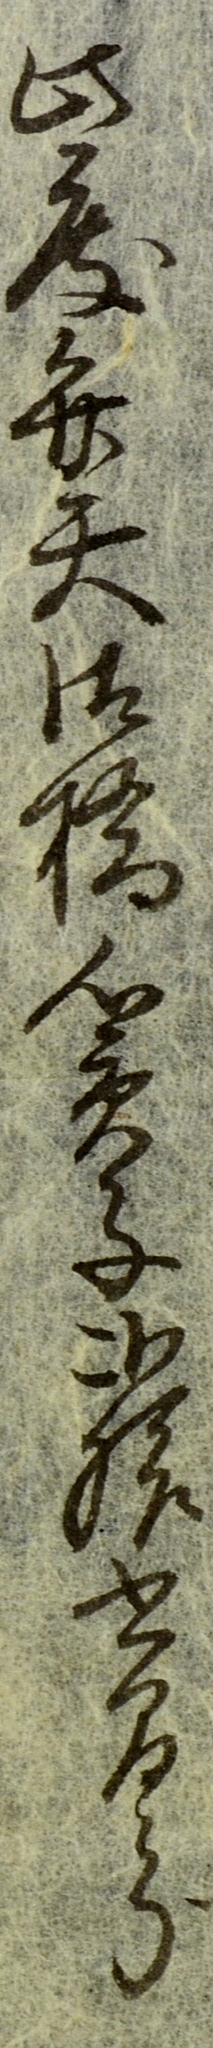此度弁天御橋簀子弐拾六間分
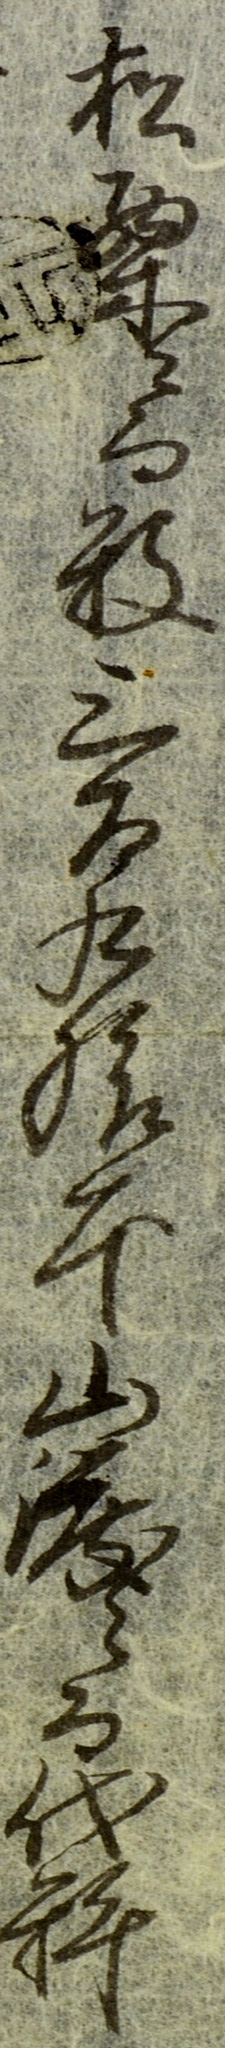松栗ニ而数三百九拾本山渡ニ而代料
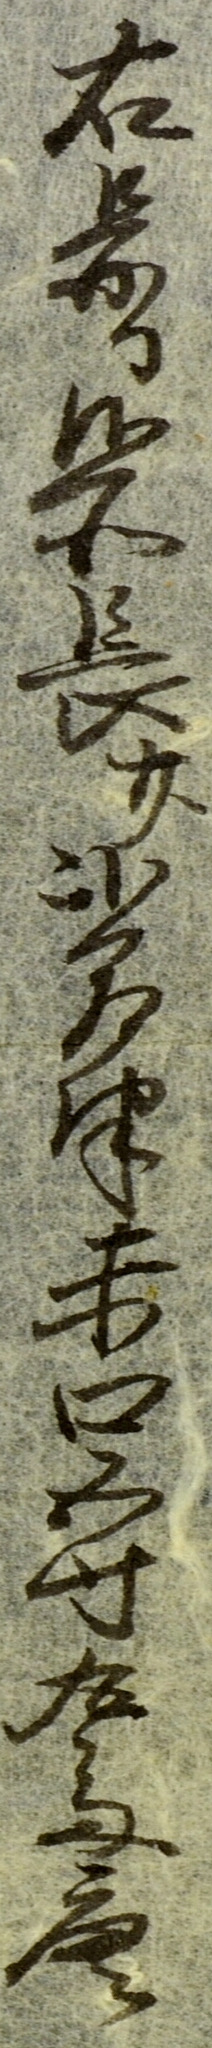右図り候所長サ弐間半末口五寸丸太唐
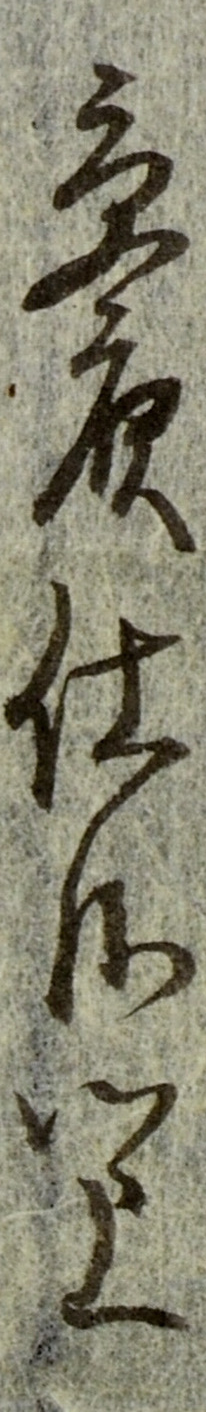受取仕候以上
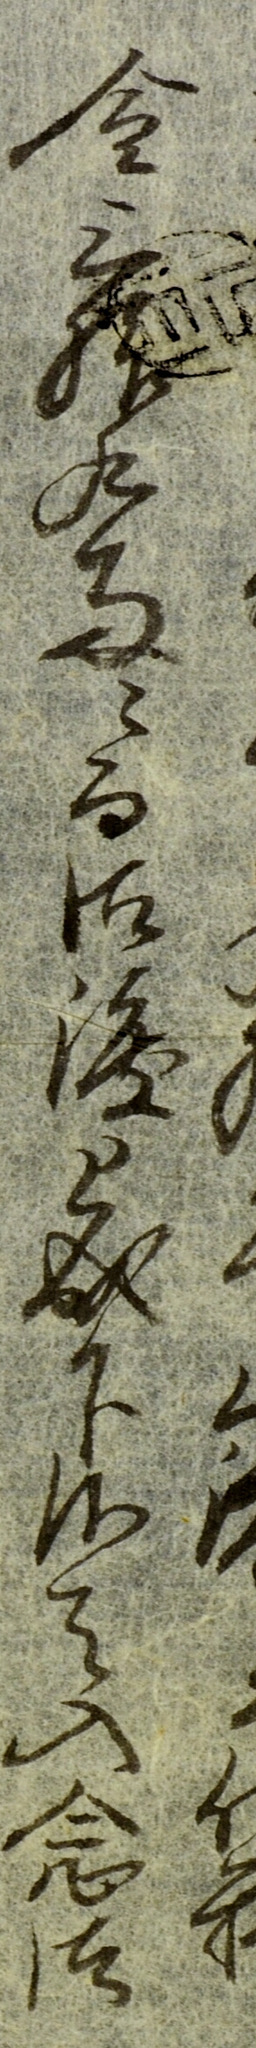金三拾㊞九両ニ而御渡被成下候者入念御
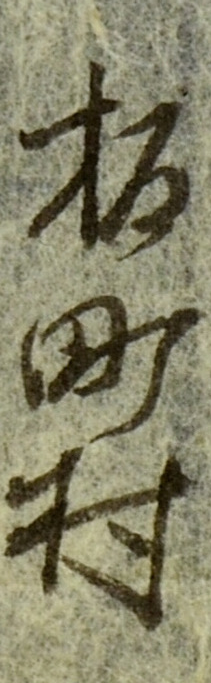板町村
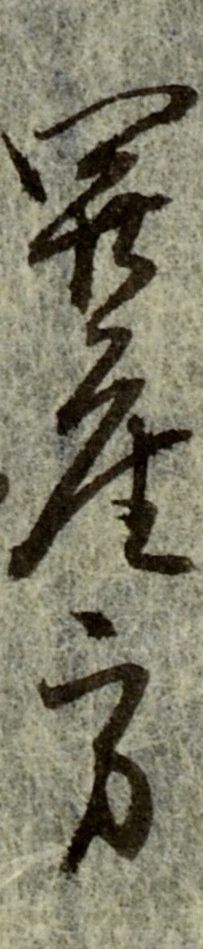開産方
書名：覚
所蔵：伊那市立高遠町図書館・合同会社AMANE
